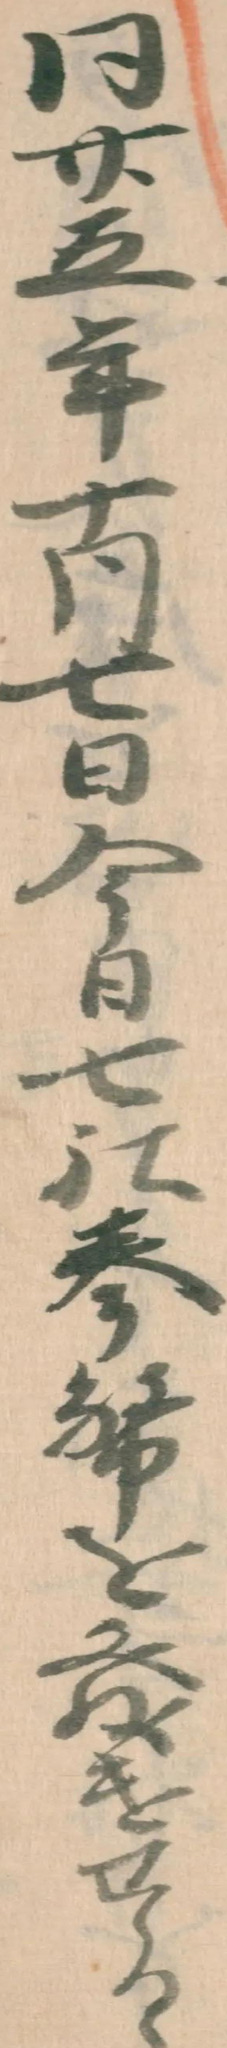同廿五年十月七日今日七社奉幣を発遣せらるゝ
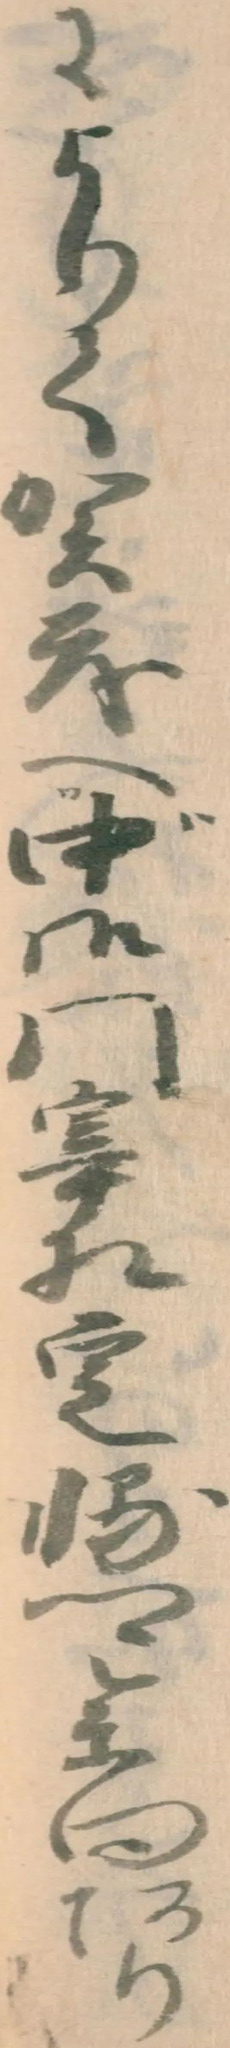によりて賀茂へ◦中御門宰相定輔卿参向あり
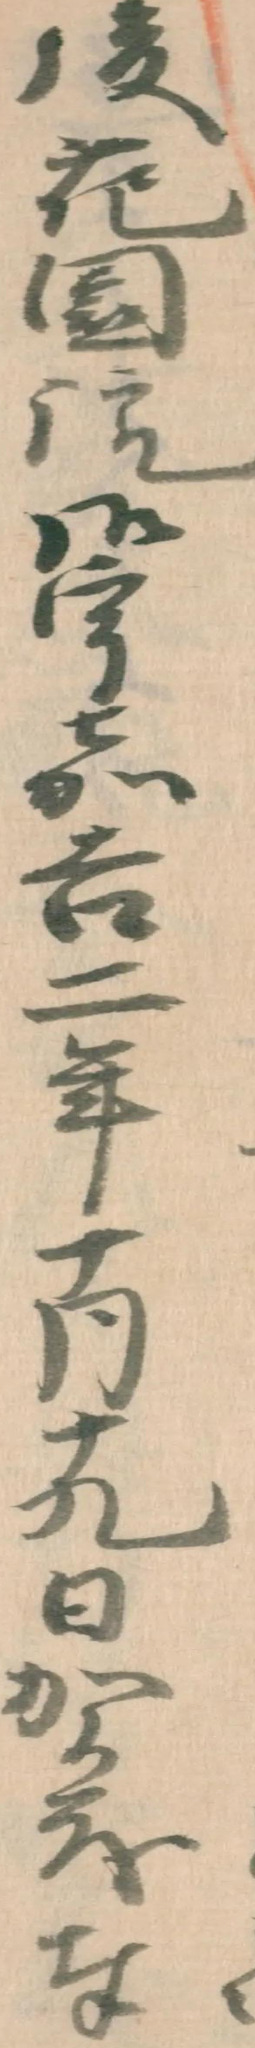後花園院御宇嘉吉二年十月十九日賀茂奉
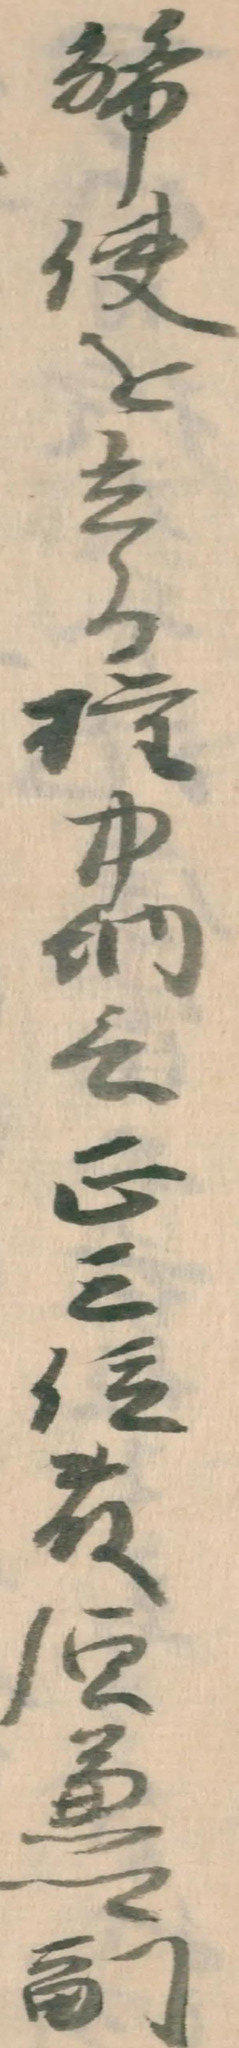幣使を立らる権中納言正三位藤原兼卿副
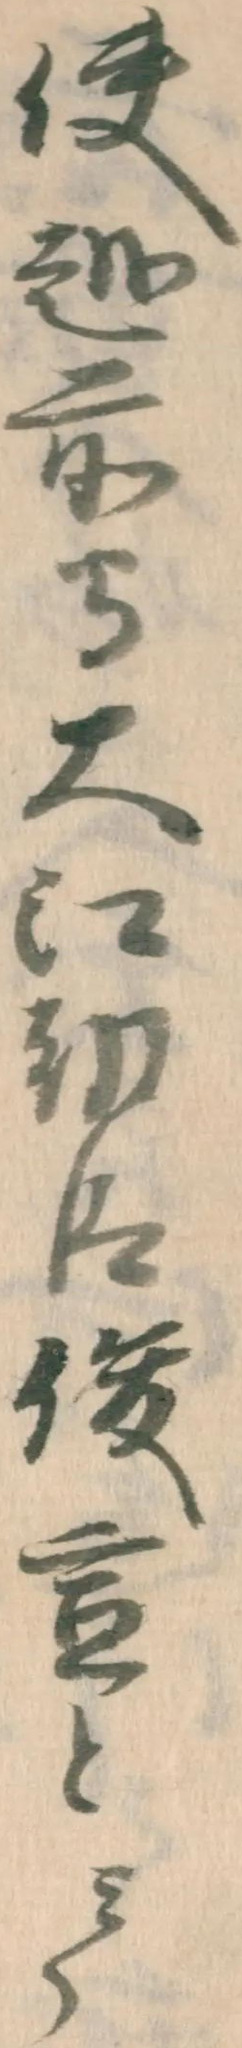使越前守大江朝臣俊宣と云々
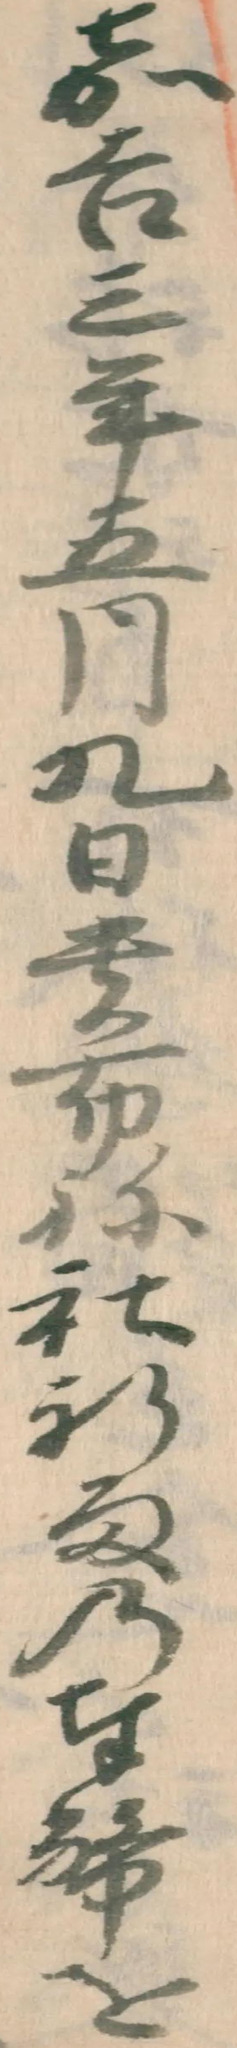嘉吉三年五月九日貴ふね社祈雨の奉幣を
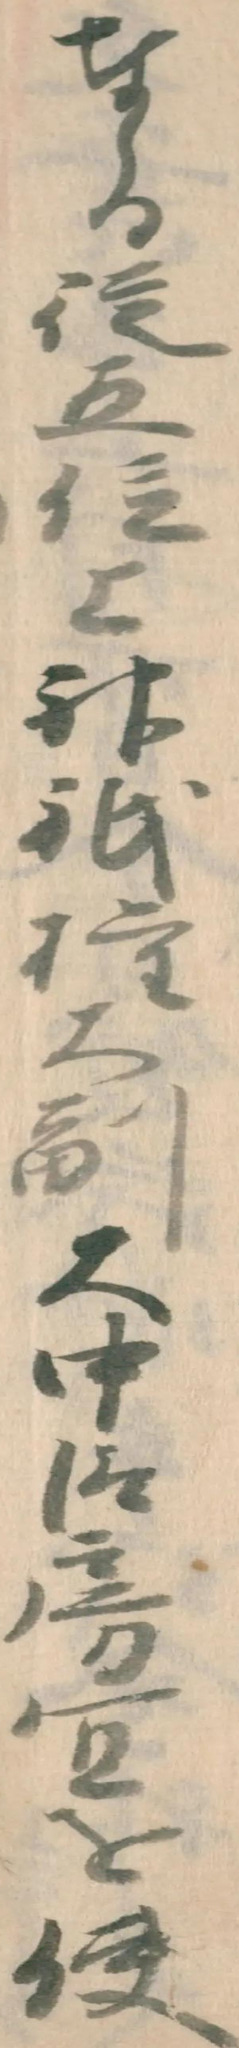奉らる従五位上神祇権大副大中臣房宜を使
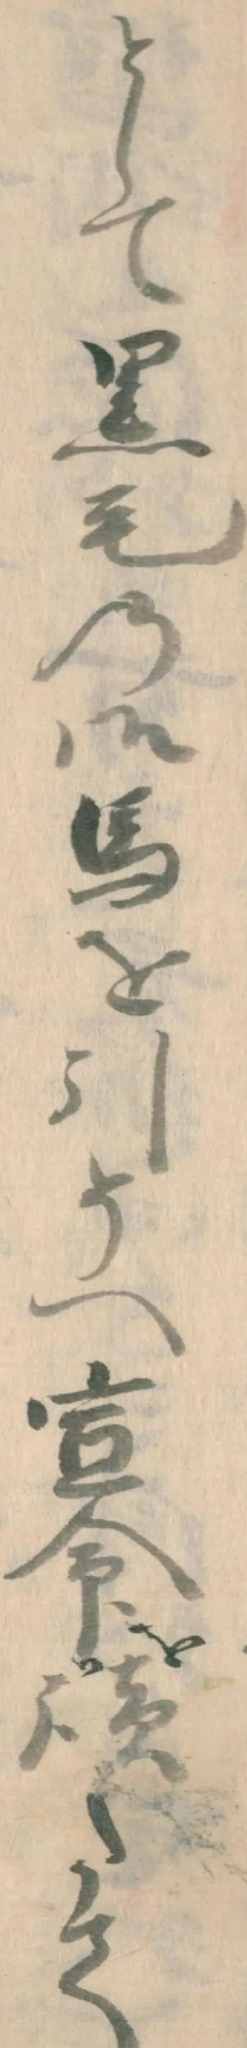として黒毛の御馬を引そへ宣命◦読たて

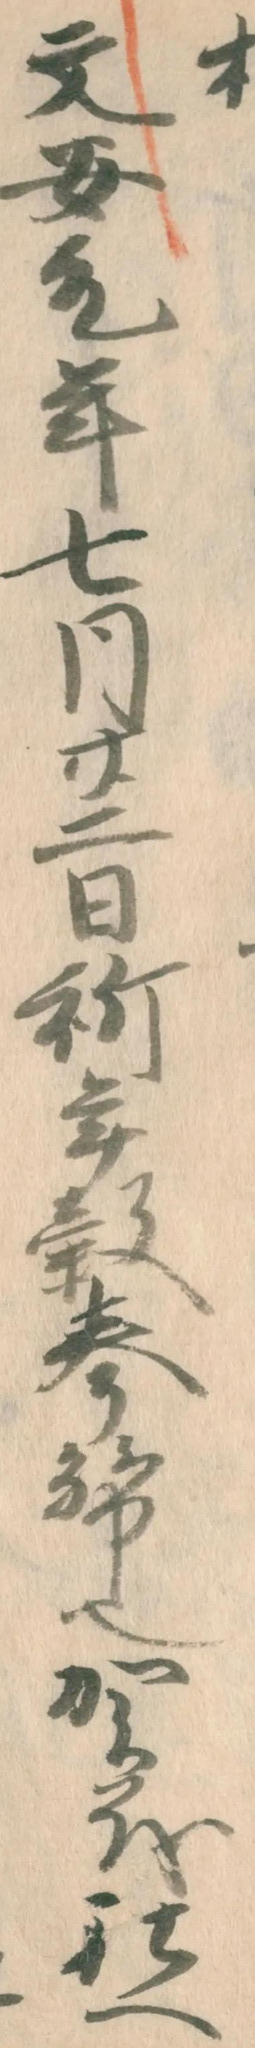文安元年七月廿二日祈年穀奉幣也賀茂社へ
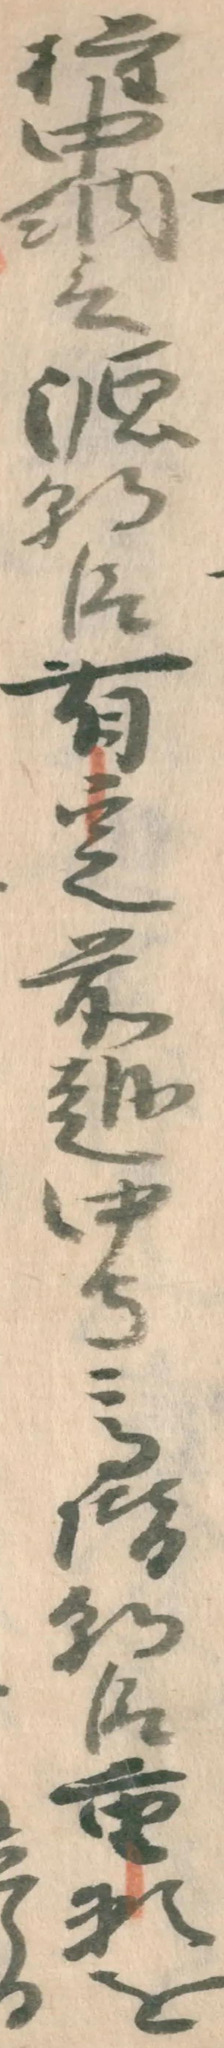権中納言源朝臣有-定前越中守高階朝臣重-頼を立らる
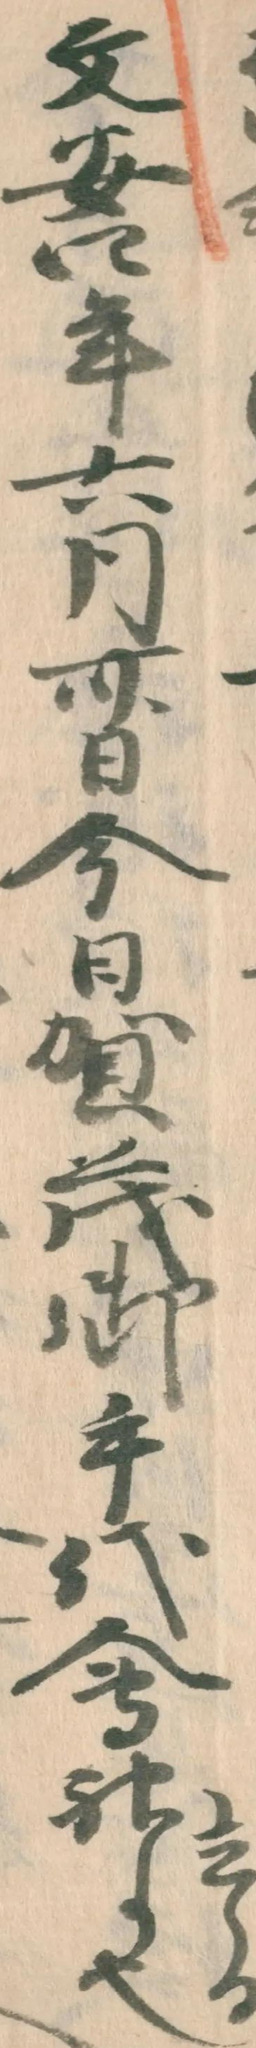文安四年六月卅日今日賀茂御手代会神事也
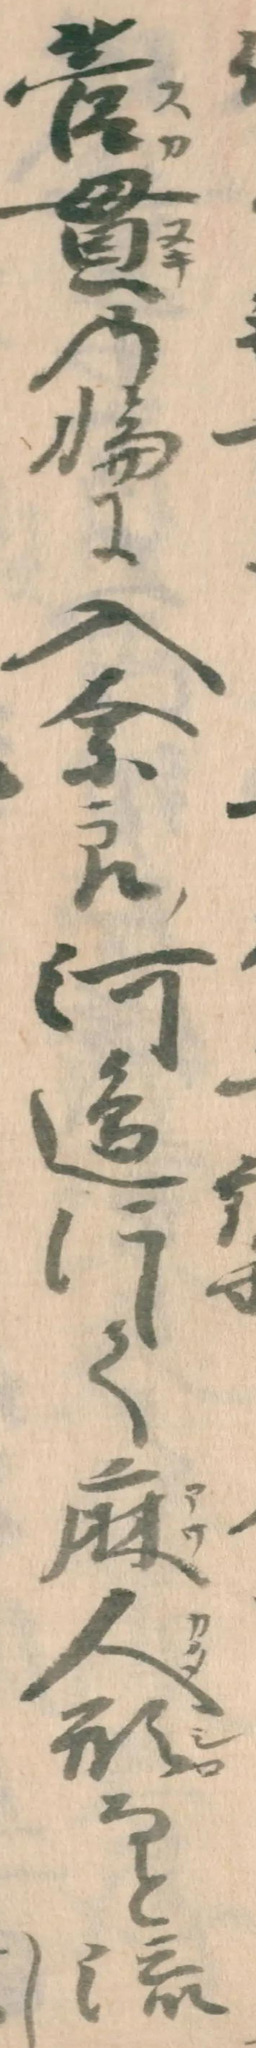菅貫の輪に入奈良河辺にして麻人形なと流し
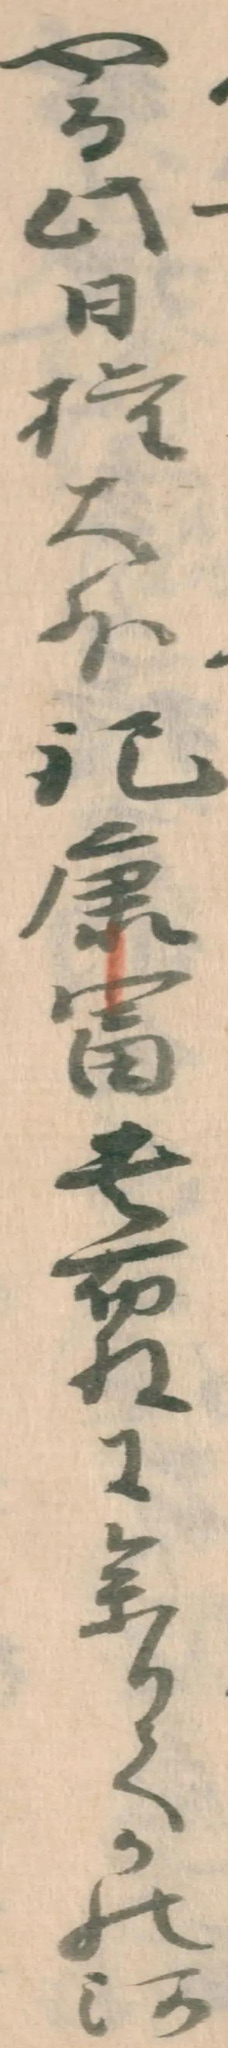やる此日権大外記康-富貴ふねに参りてかの河
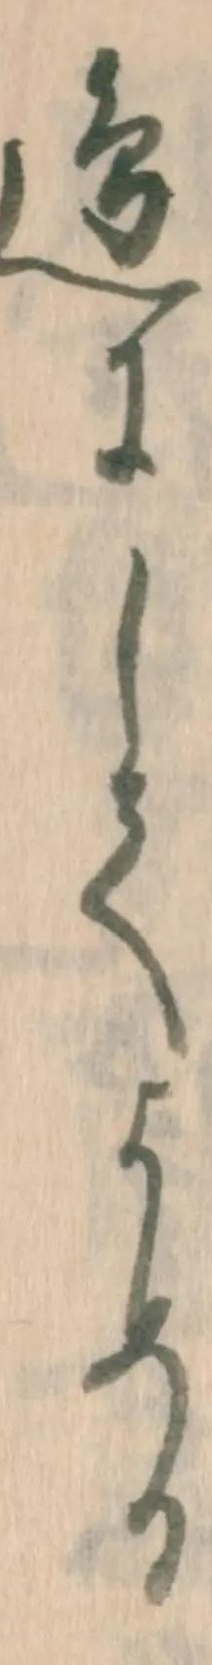辺にしてよめる
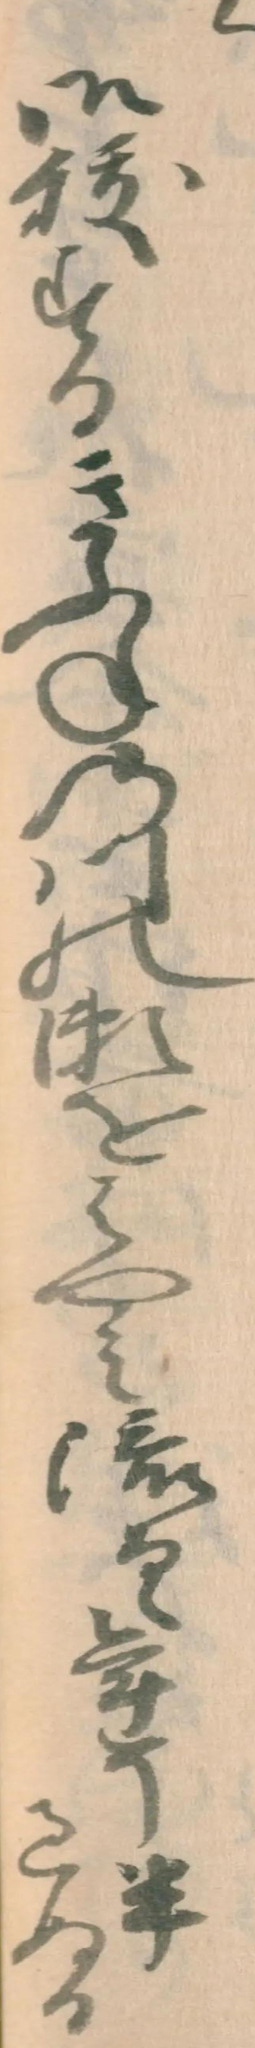御祓するきふねの川の瀬をはやみ流るゝ年そ半過ぬる
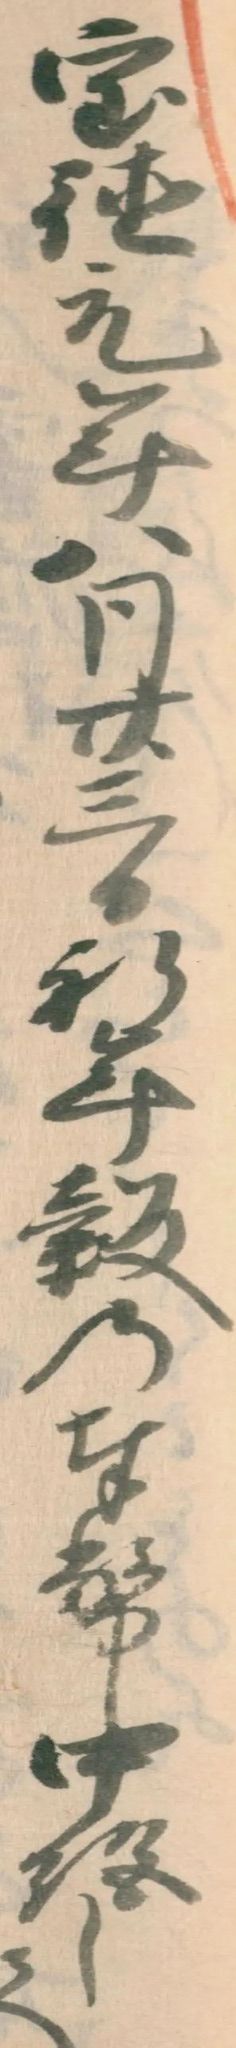宝徳元年八月廿三日祈年穀の奉幣中絶して
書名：賀茂社記録. 第1冊
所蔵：国立国会図書館 National Diet Library, JAPAN
